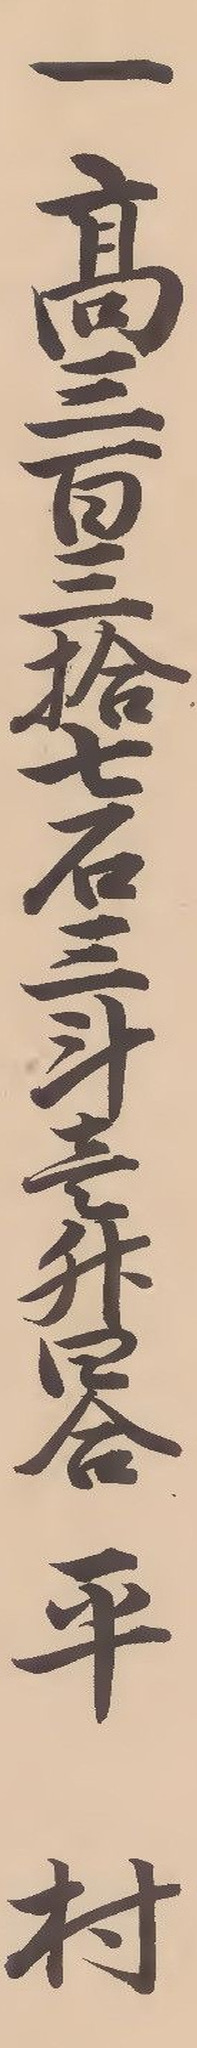一高三百三拾七石三斗壱升四合平村
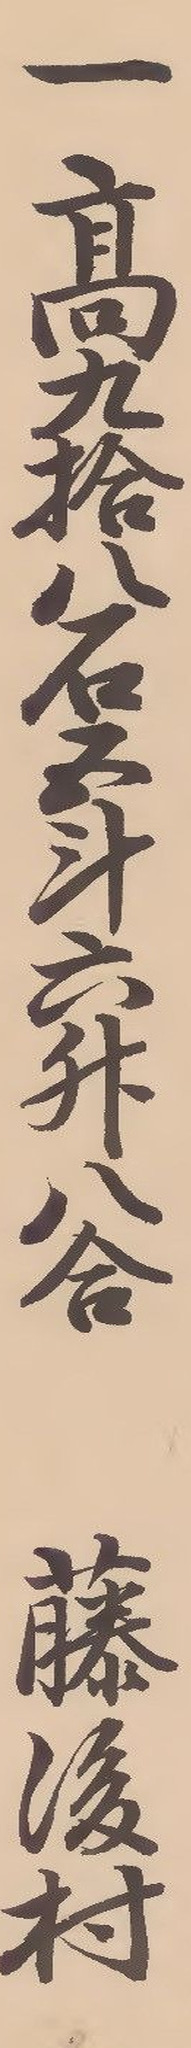一高九拾八石五斗六升八合藤後村

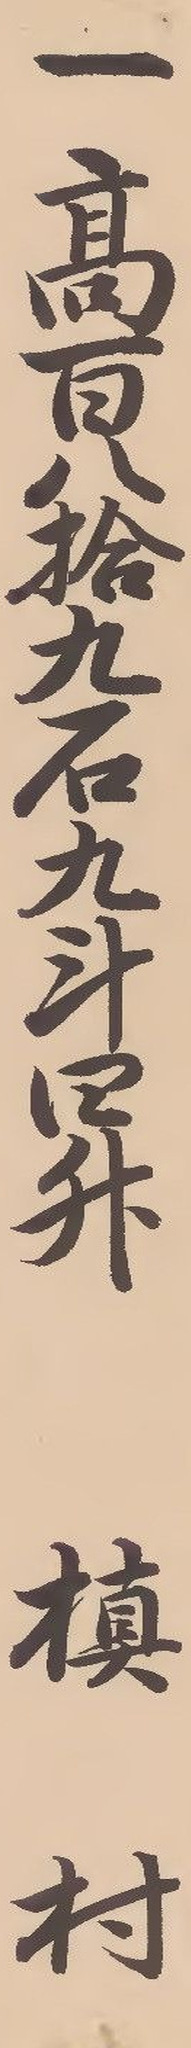一高百八拾九石九斗四升槙村
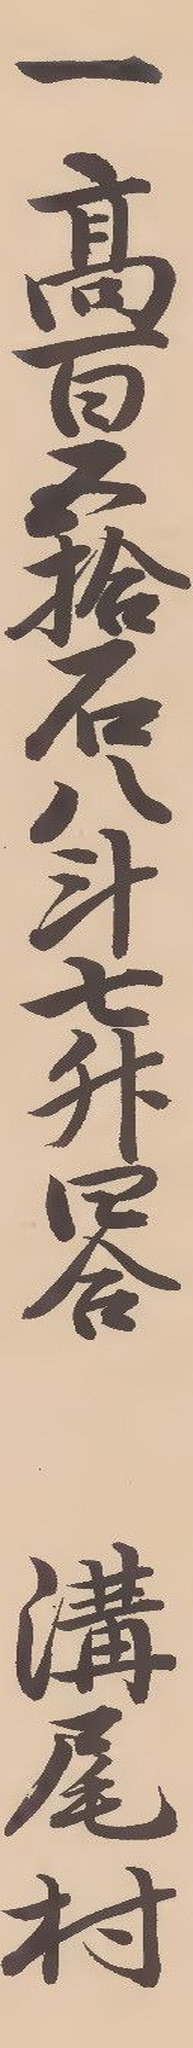一高百五拾石八斗七升四合溝尾村
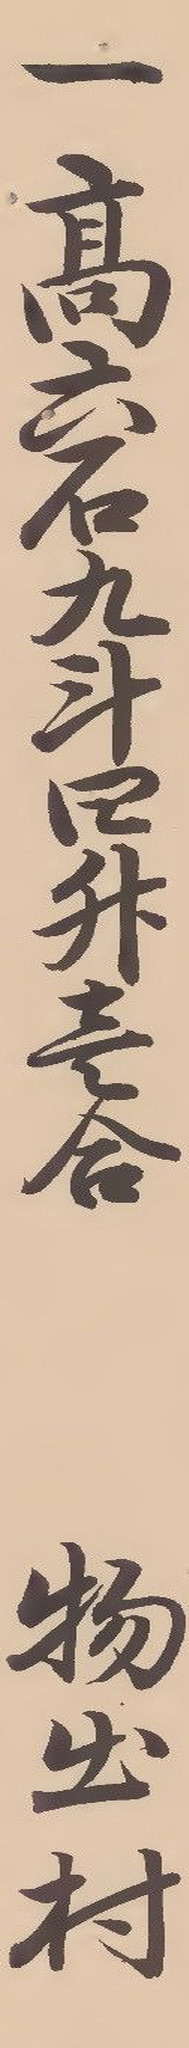一高六石九斗四升壱合物出村
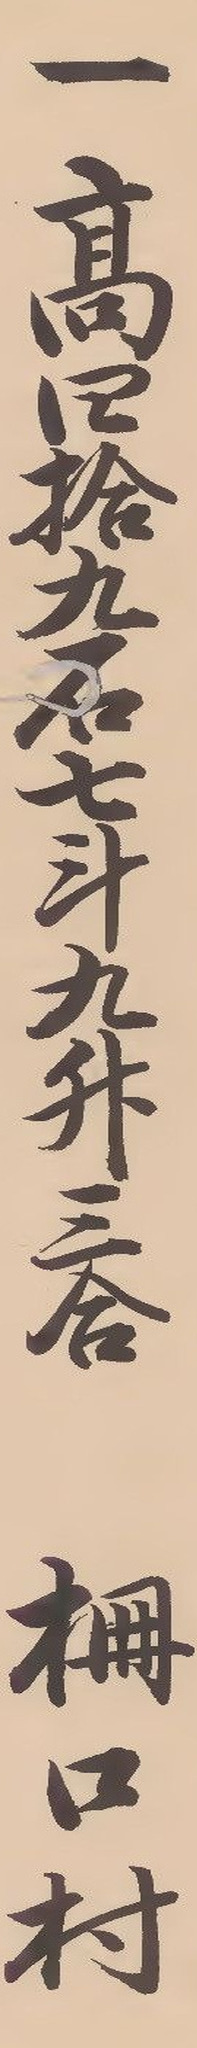一高四拾九石七斗九升三合柵口村
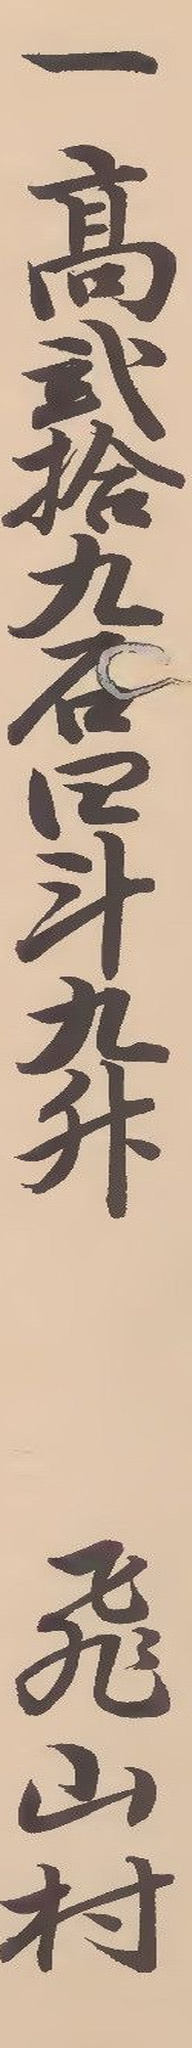一高弐拾九石四斗九升飛山村
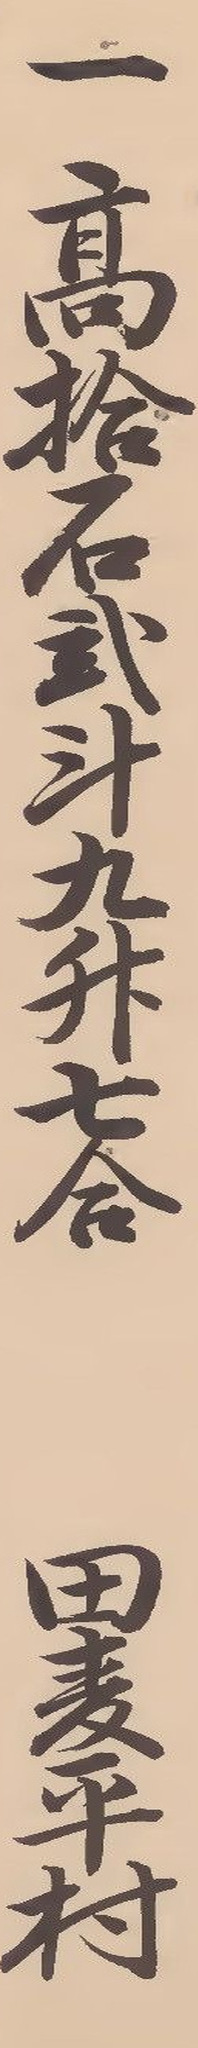一高拾石弐斗九升七合田麦平村
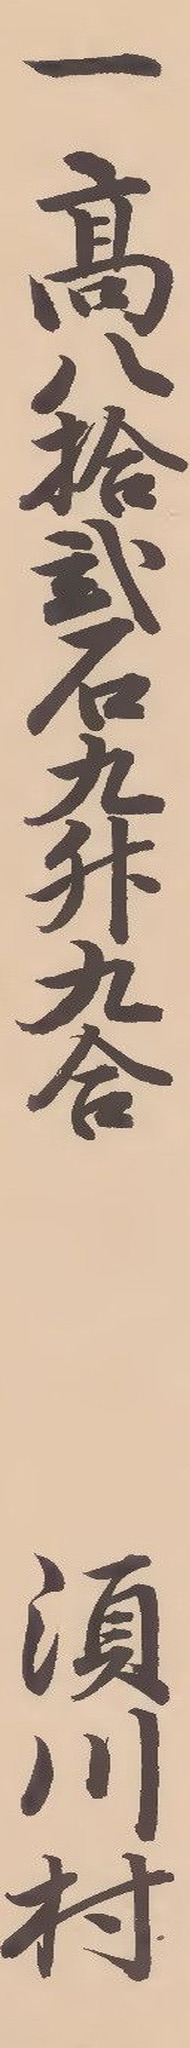一高八拾弐石九升九合須川村

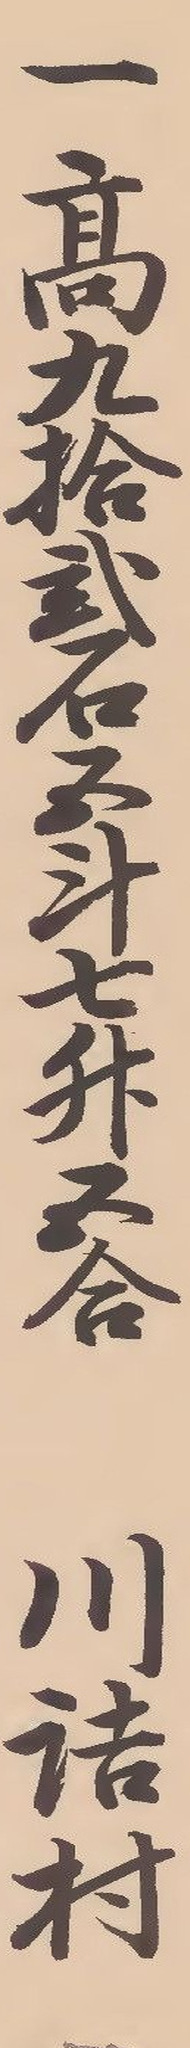一高九拾弐石五斗七升五合川詰村
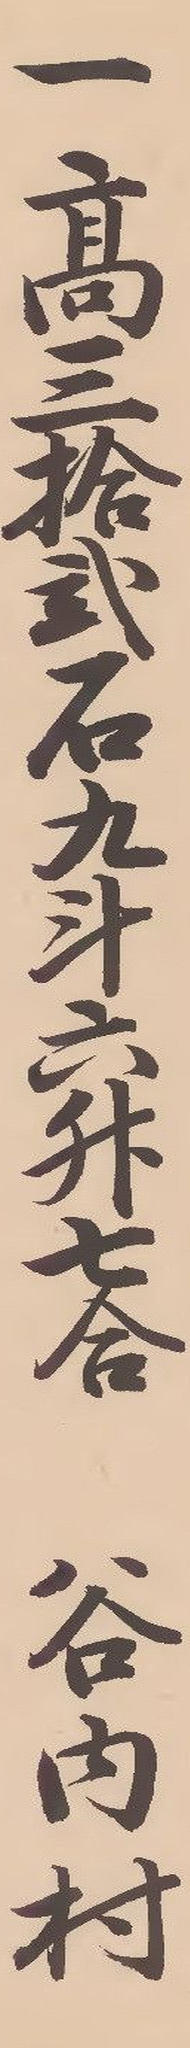一高三拾弐石九斗六升七合谷内村
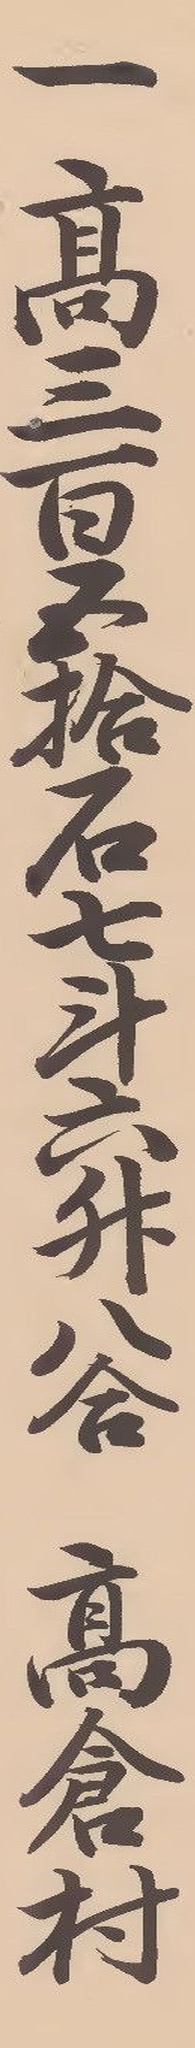一高三百五拾石七斗六升八合高倉村
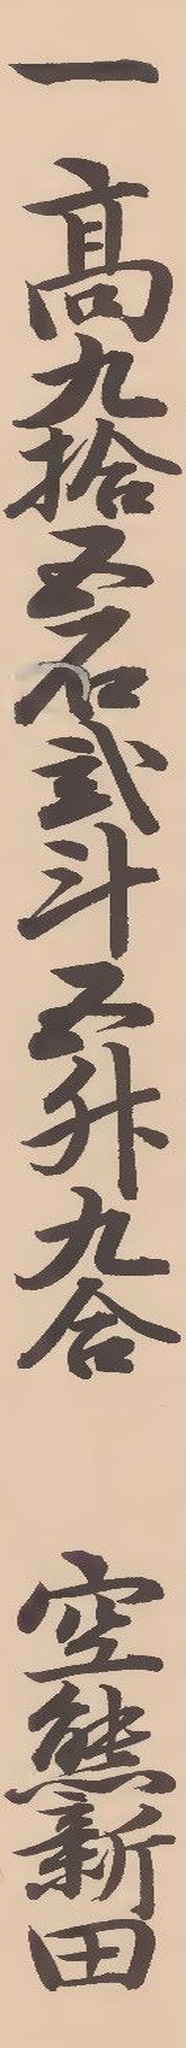一高九拾五石弐斗五升九合空熊新田
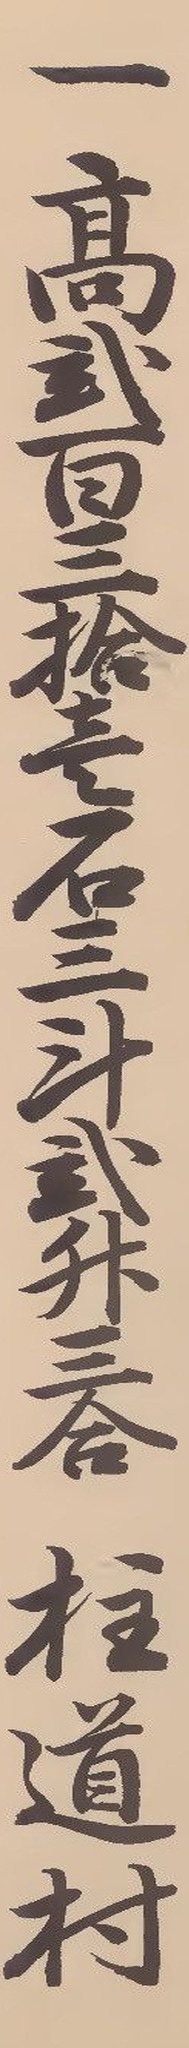一高弐百三拾壱石三斗弐升三合柱道村
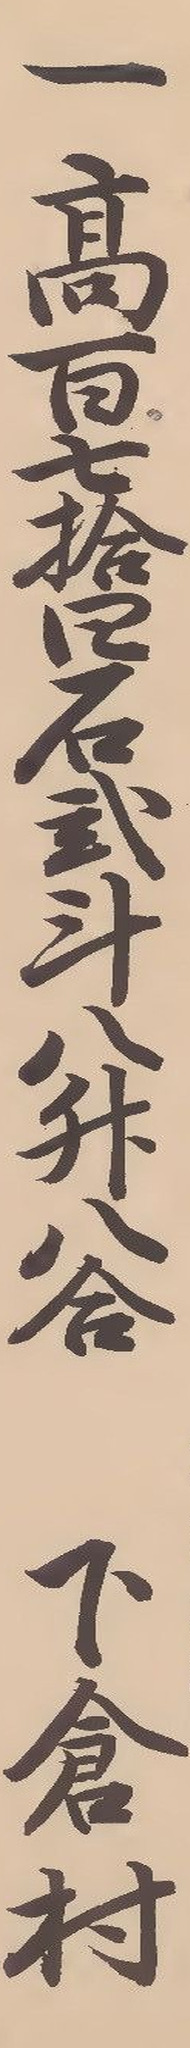一高百七拾四石弐斗八升八合下倉村
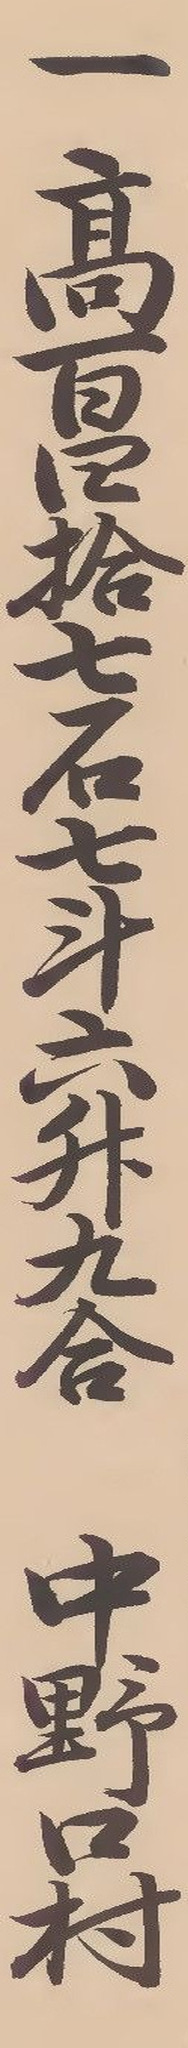一高百四拾七石七斗六升九合中野口村
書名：越後国郷帳　上
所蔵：国立公文書館 National Archives of Japan
